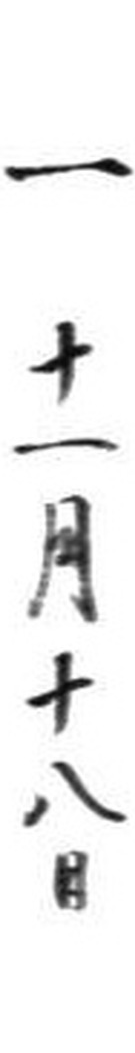一十一月十八日
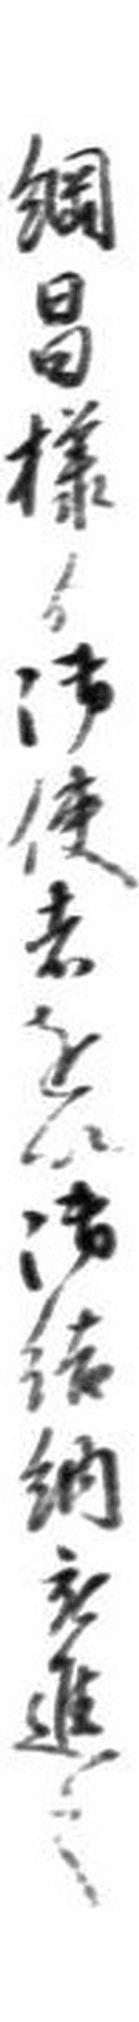綱昌様ゟ御使者を以御結納被進之

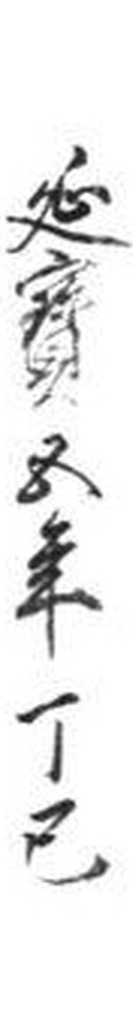延宝五年丁巳
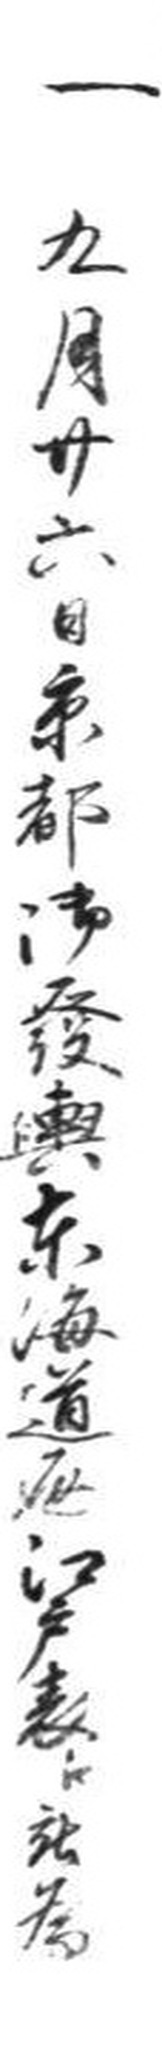一九月廿六日京都御発輿東海道通江戸表江被為
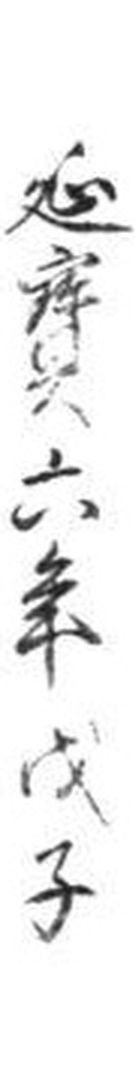延宝六年戊子
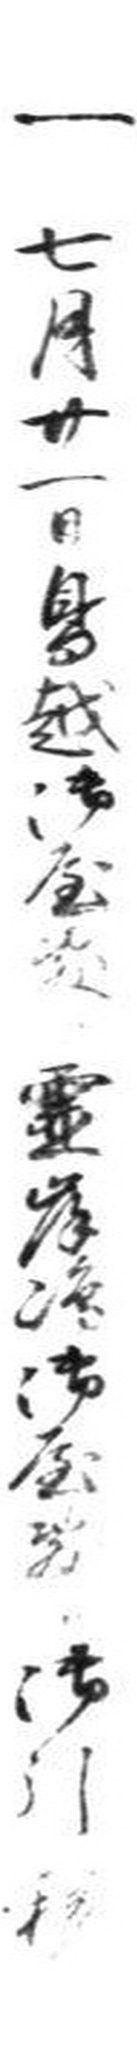一七月廿一日鳥越御屋敷霊岸嶋御屋敷江御引移
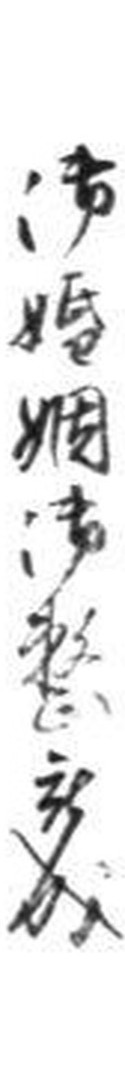御婚姻御整被成
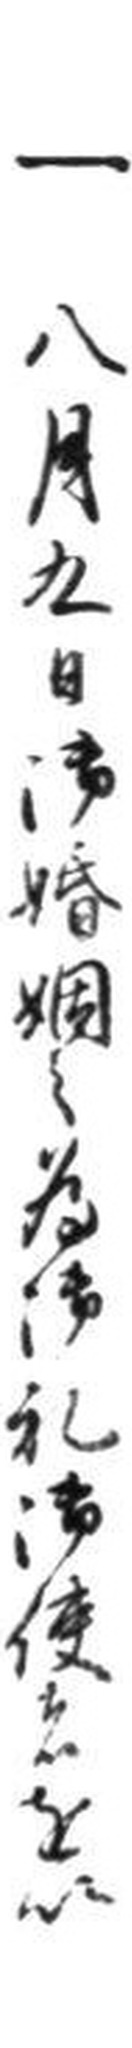一八月九日御婚姻之為御礼御使者を以
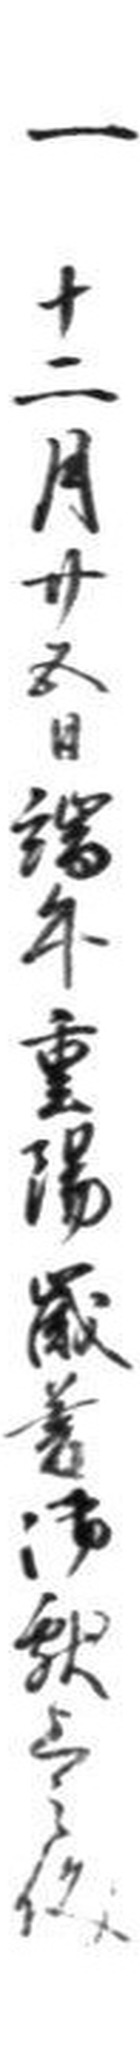一十二月廿五日端午重陽歳暮御献上之儀
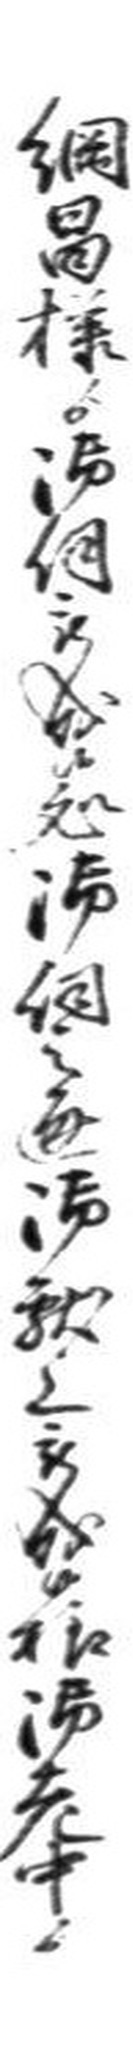綱昌様ゟ御伺被成候処御伺之通御献上被成候様御老中ゟ
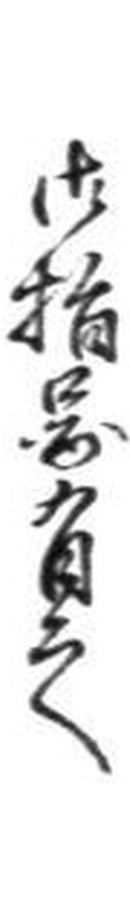御指図有之
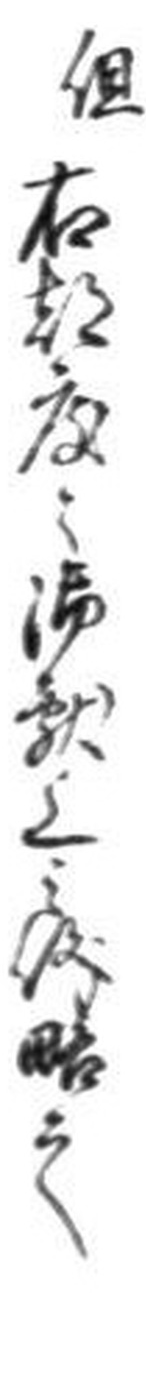但右都度之御献上之儀略之
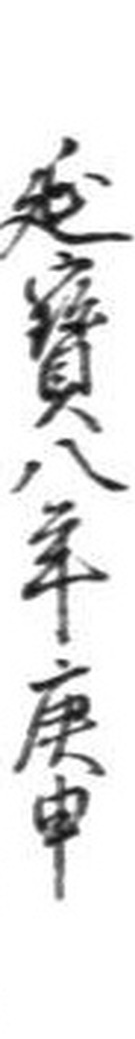延宝八年庚申
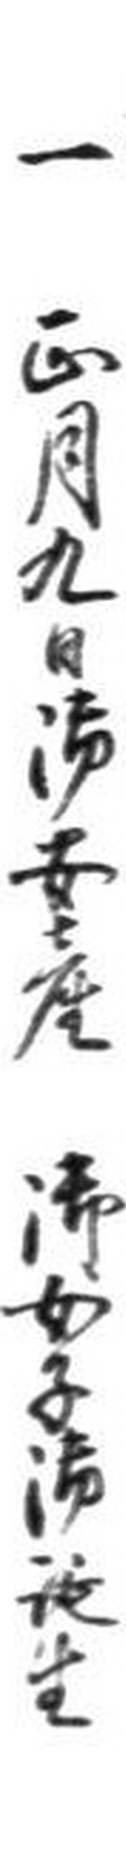一正月九日御安産御女子御誕生
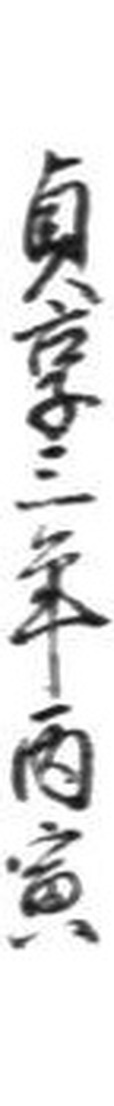貞享三年丙寅
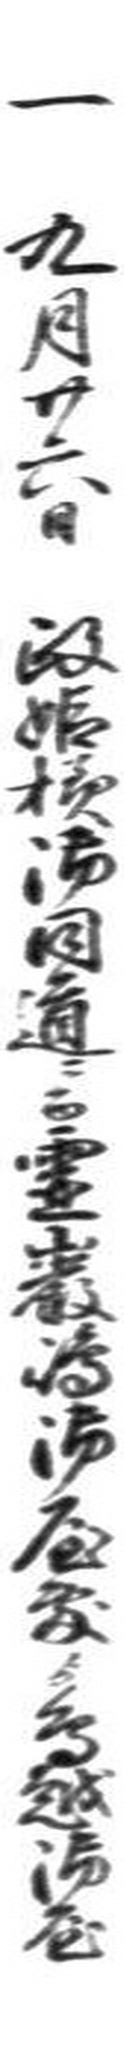一九月廿六日政姫様御同道ニ而霊巌嶋御屋敷ゟ鳥越御屋
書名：家譜 十五 綱昌公 従天和元年到元禄十二年
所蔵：福井県文書館 Fukui Prefectural Archives
